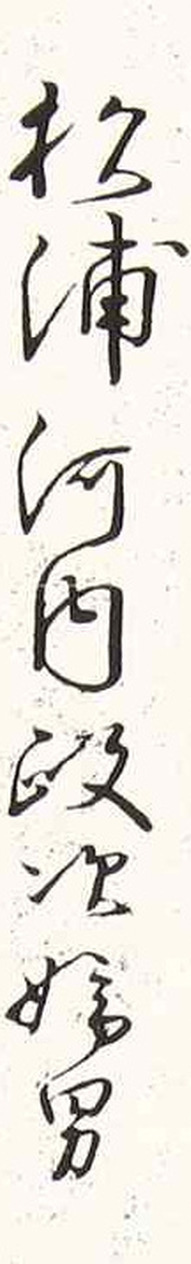杉浦河内政次嫡男
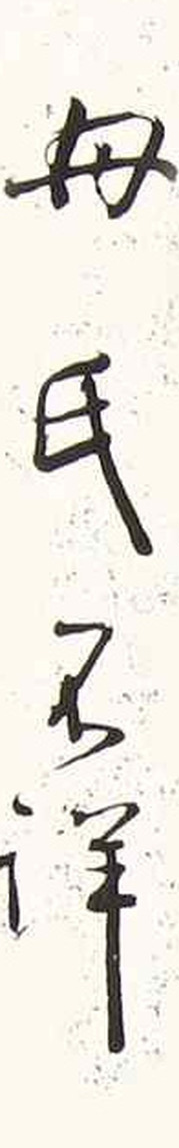母氏不詳
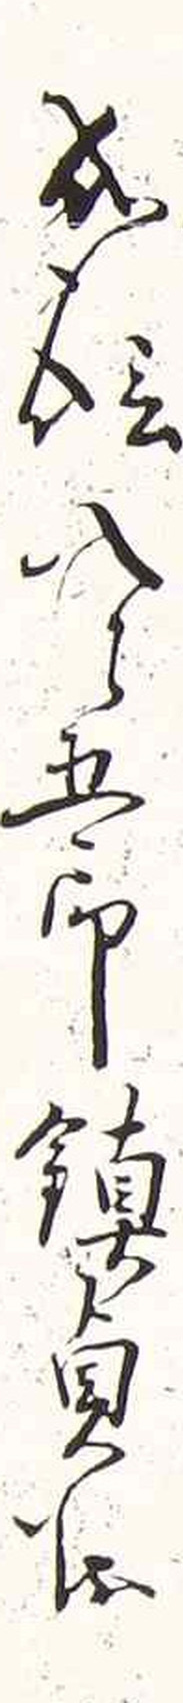成信八郎五郎鎮貞儀
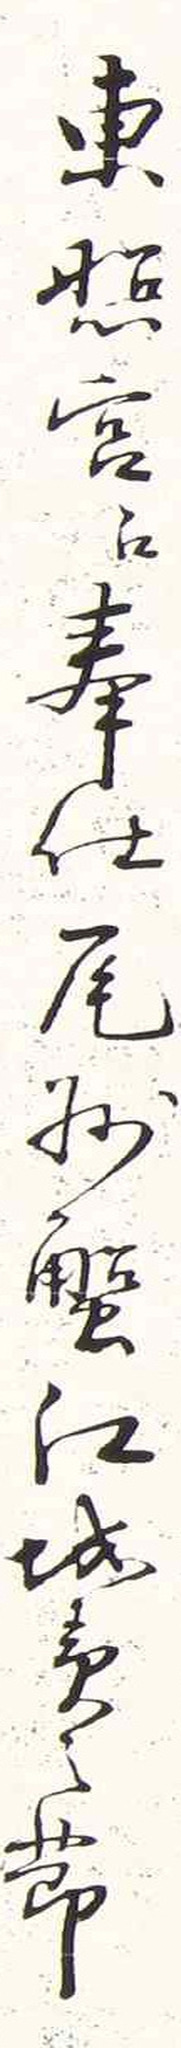東照宮江奉仕尾州蟹江城責之節

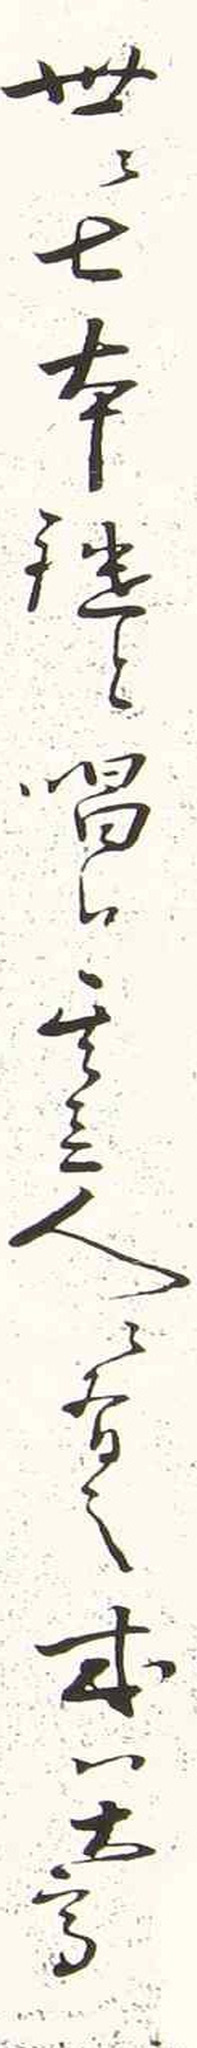世ニ七本鑓と唱候其壱人ニ有之或ハ大高
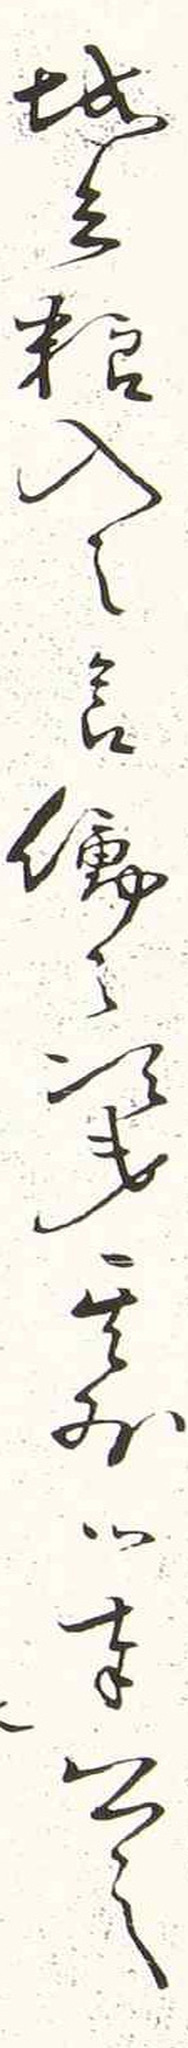城兵粮入之節働之次第其外御奉公之
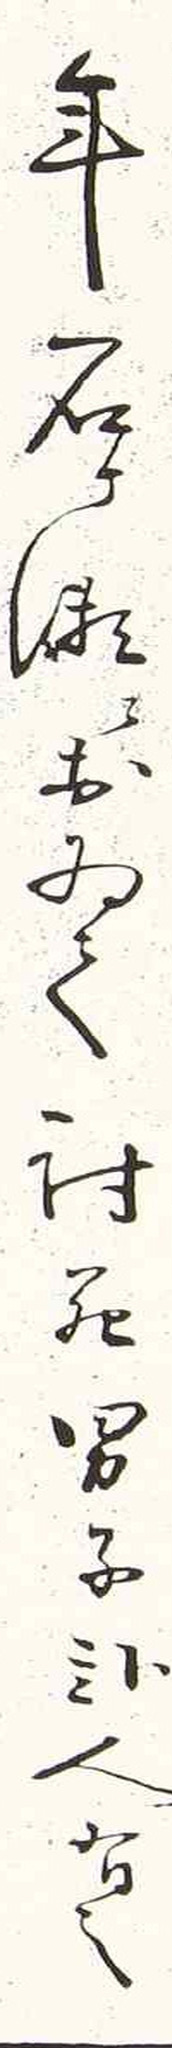年石ケ瀬ニおゐて討死男子弐人有之
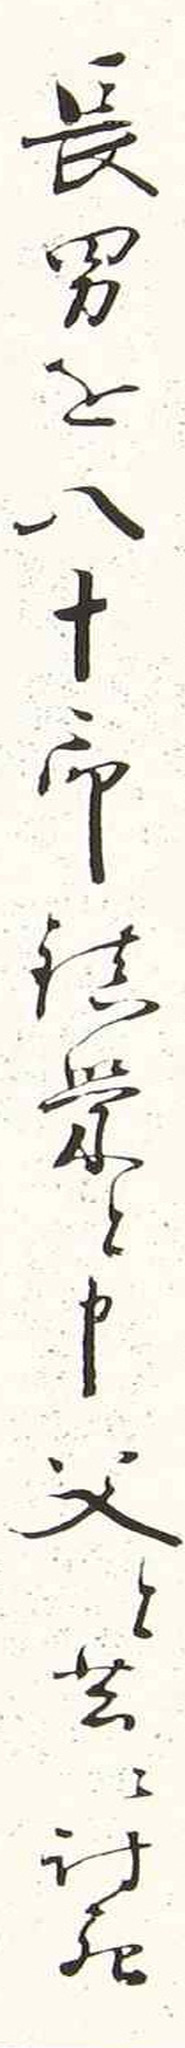長男を八十郎鎮栄と申父と共ニ討死
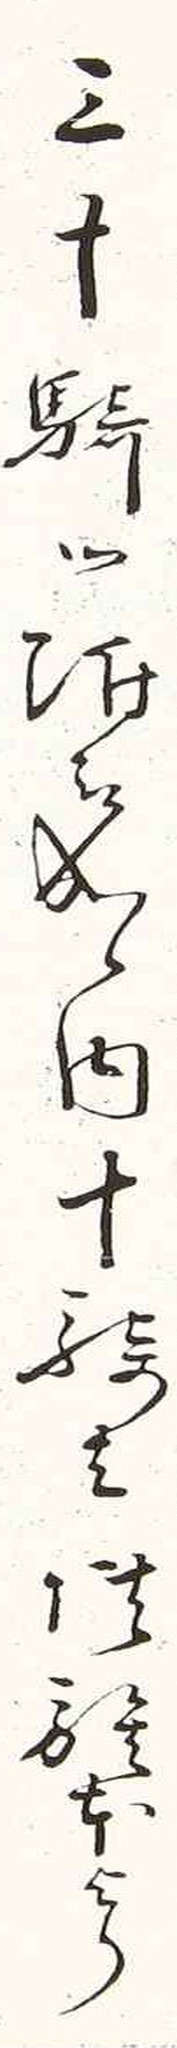三十騎御附被成候内十騎者御旗本より
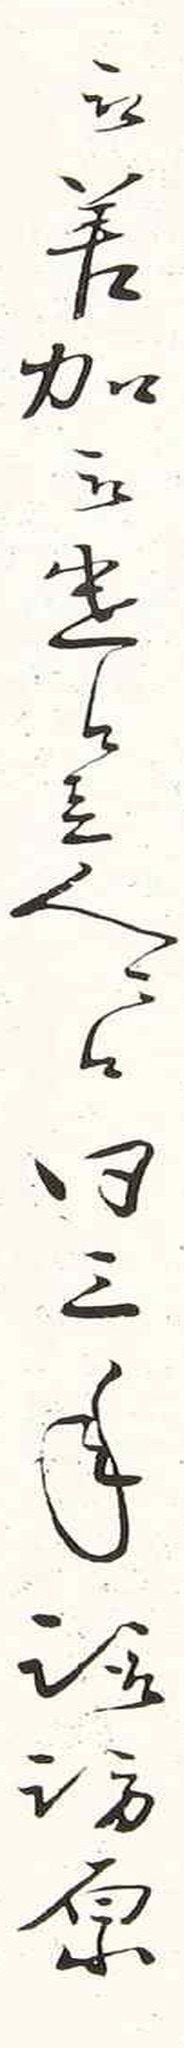被差加被遣候壱人ニ候同三年諏訪原
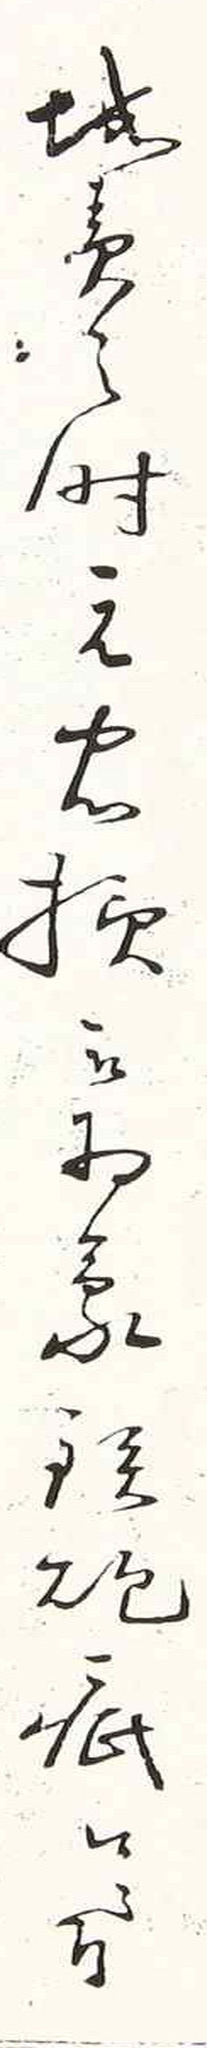城責之時元忠様被為蒙鉄炮疵候ニ付
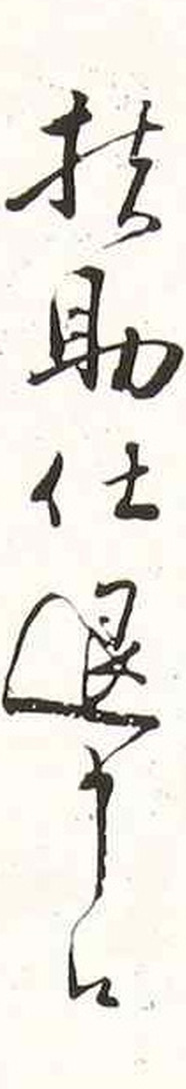扶助仕退申候
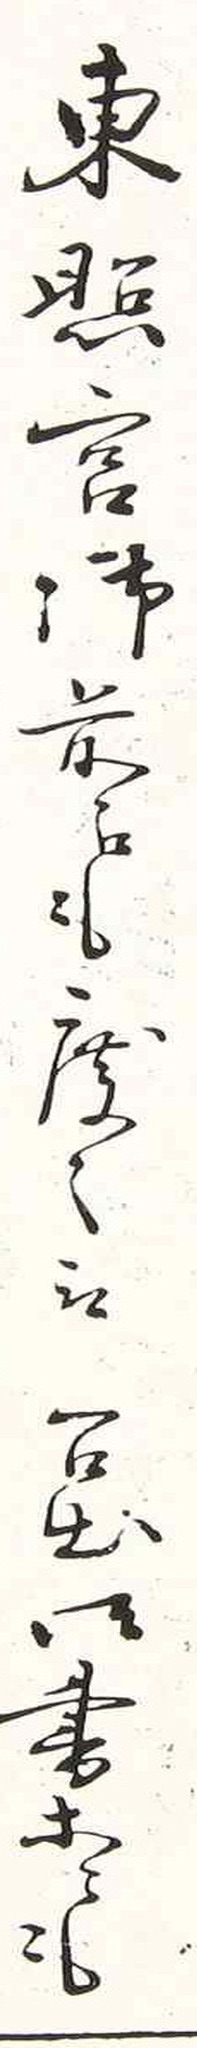東照宮御前江も度々被召出御書等ニも
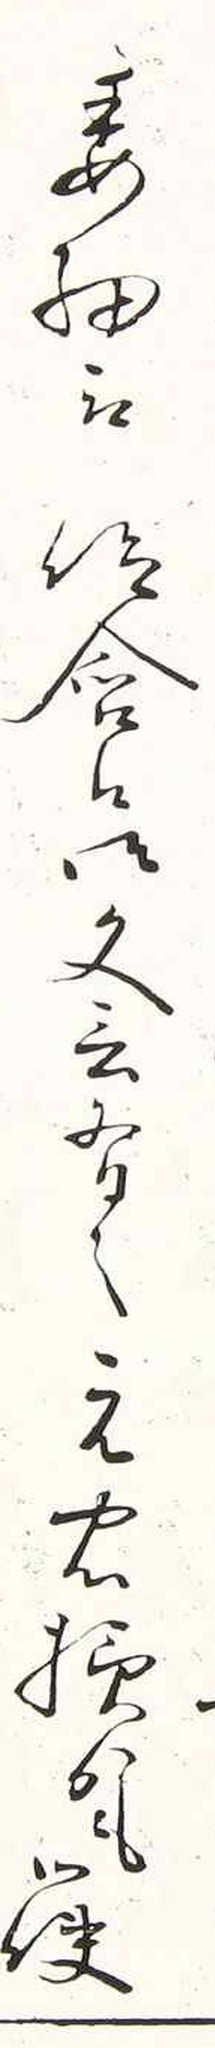委細被仰含候御文言有之元忠様ゟも御使
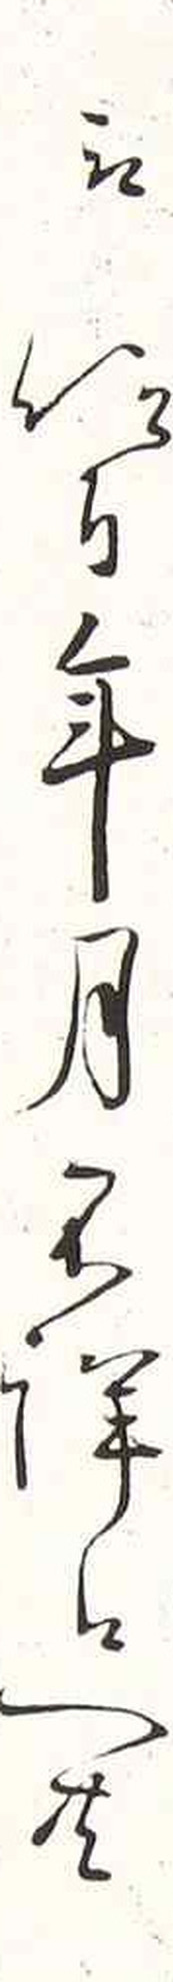被仰付年月不詳候へ共
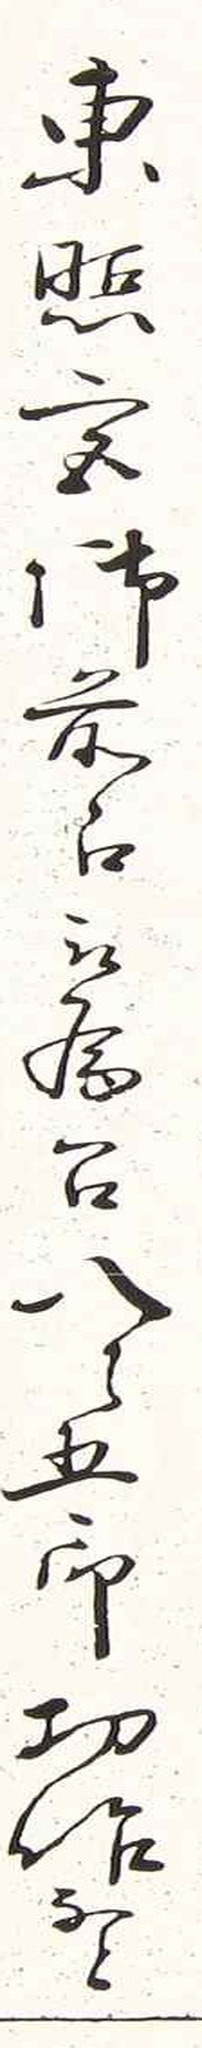東照宮御前江被為召八郎五郎功作なと
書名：諸士系譜　巻之357　す之部7
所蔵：会津若松市立会津図書館
